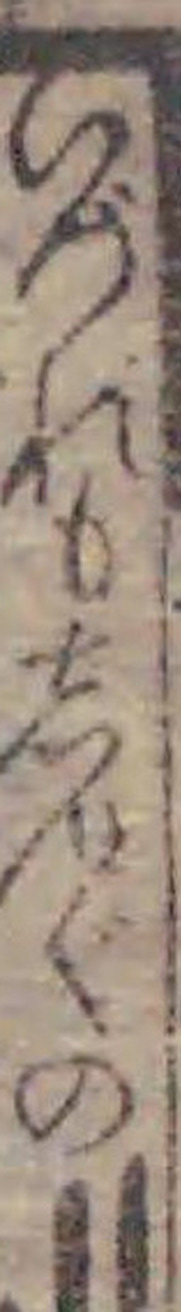いづれもしん〴〵の
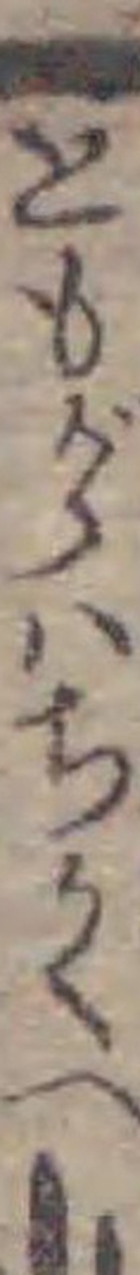ともがらはちかくへ
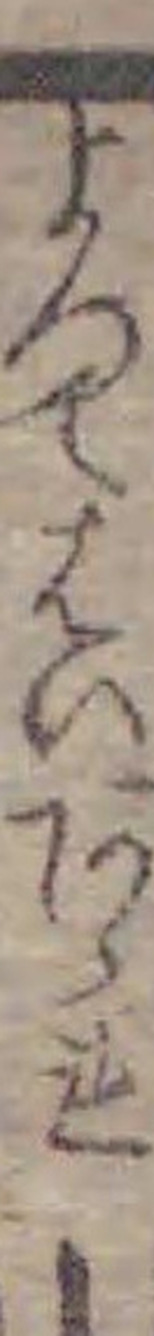よつてはいあられ
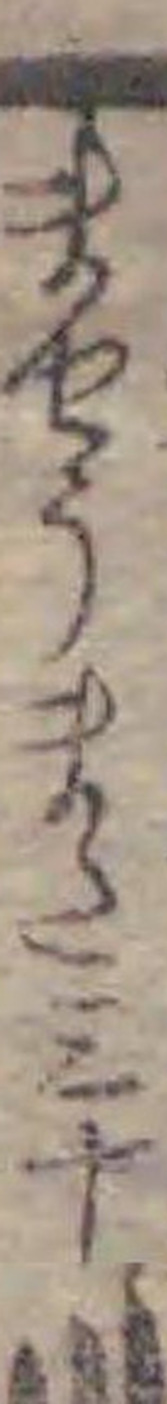ませうまた三十
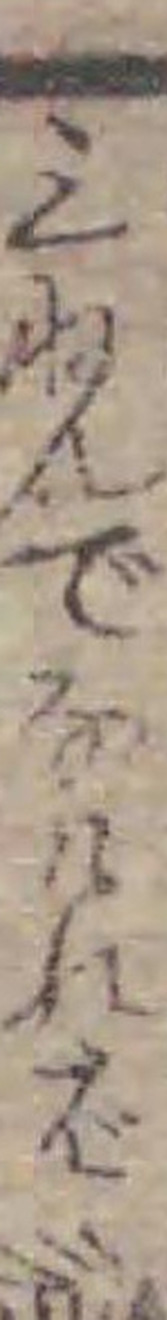三ねんでなければ
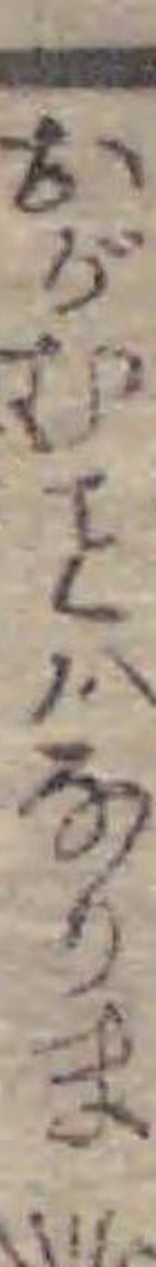おがむことはなりま
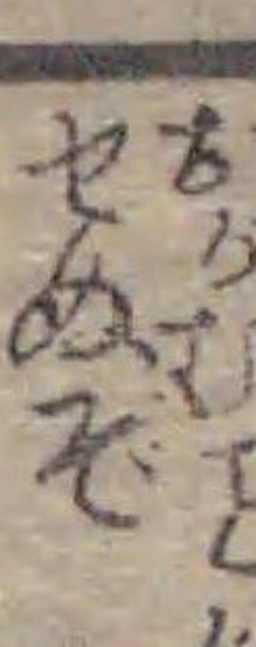せぬぞ
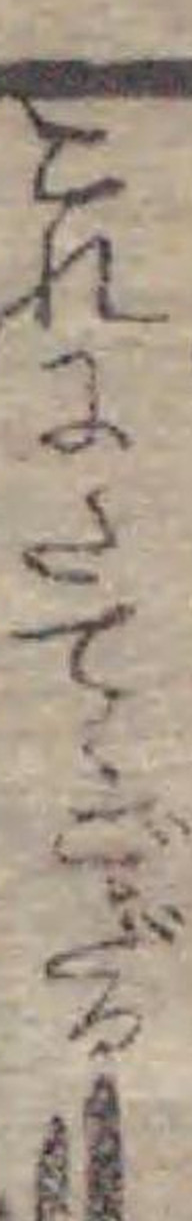これにたてゝござる
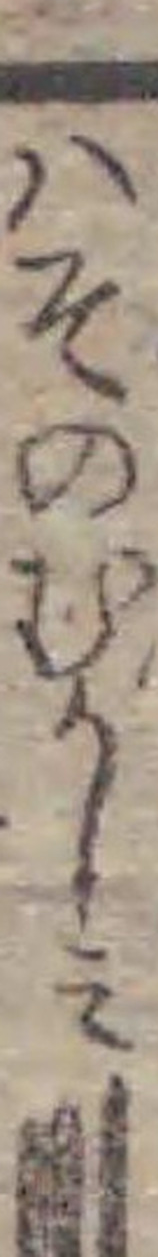はそのむかしみ
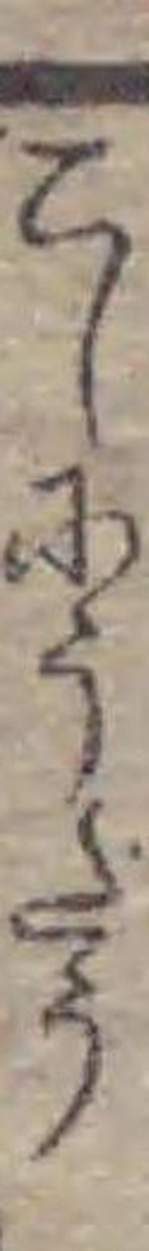こしにうだう
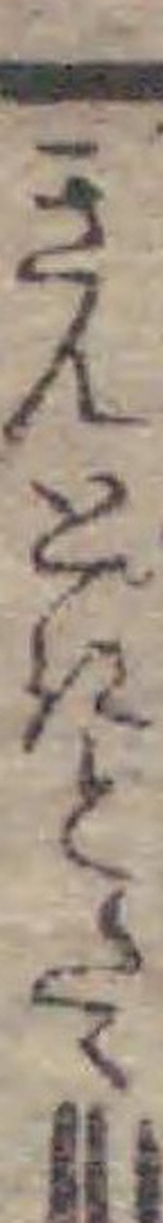きんときとたゝ
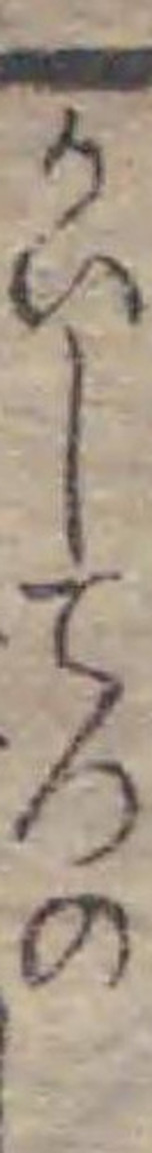かいしてつの
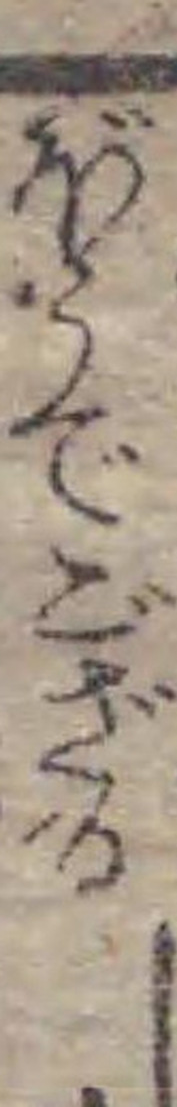ぼうでござる
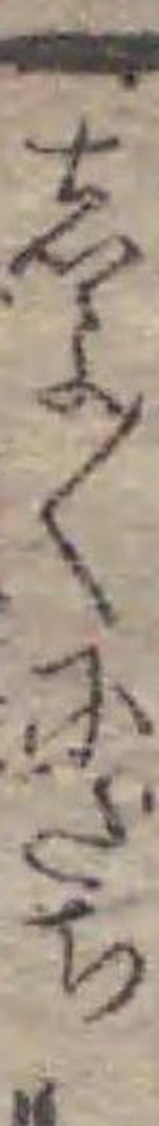しよ〴〵にたち
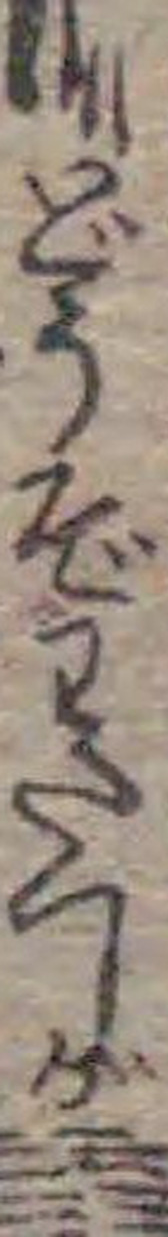どうぞわたくしが
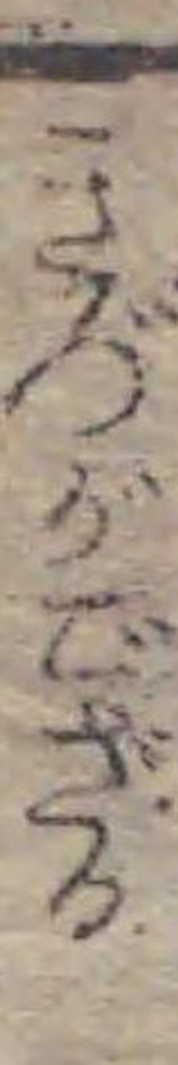きづがござる
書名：化物七段目 : 2巻
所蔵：国立国会図書館 National Diet Library, JAPAN
